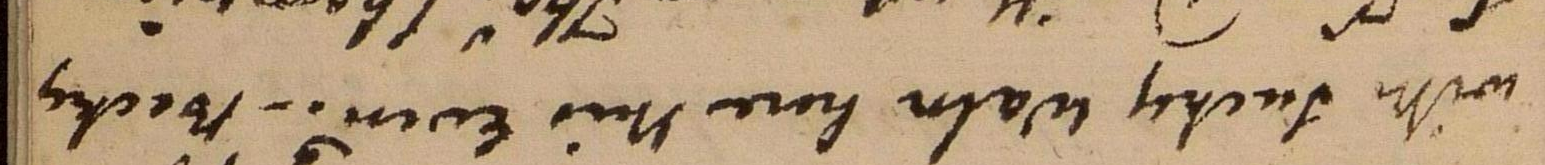with Sucky Waln here this Even^g. - Becky
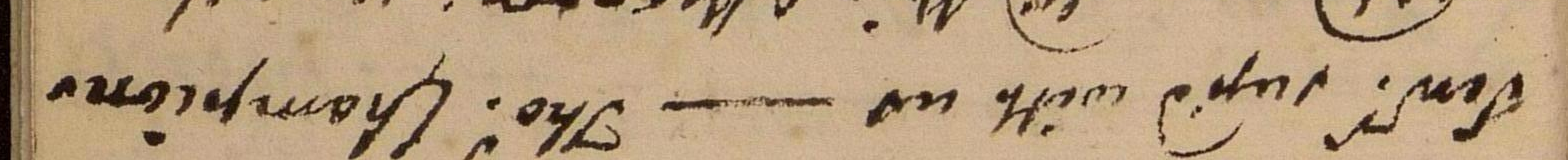Sen^r. sup'd with us- Tho^s. Champions
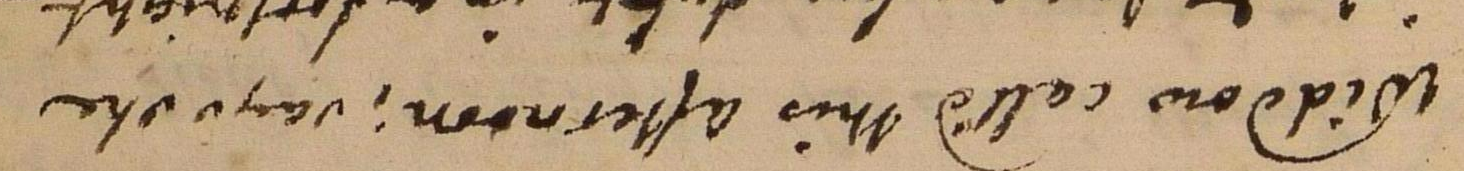Widow call'd this Afternoon; says she
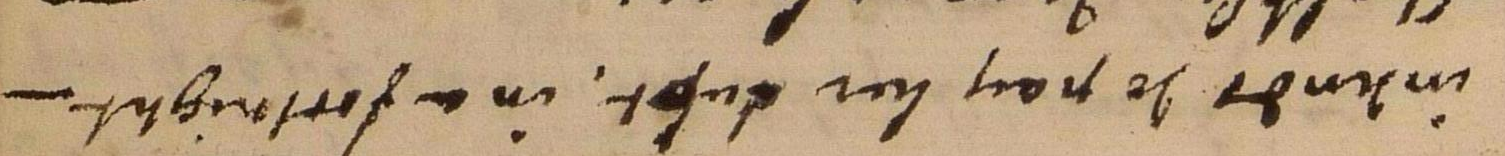intends to pay her debt, in a fortnight-
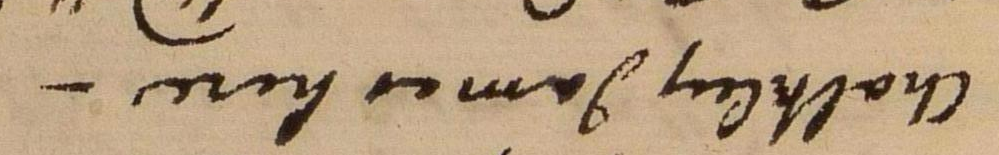Chalkley James here-
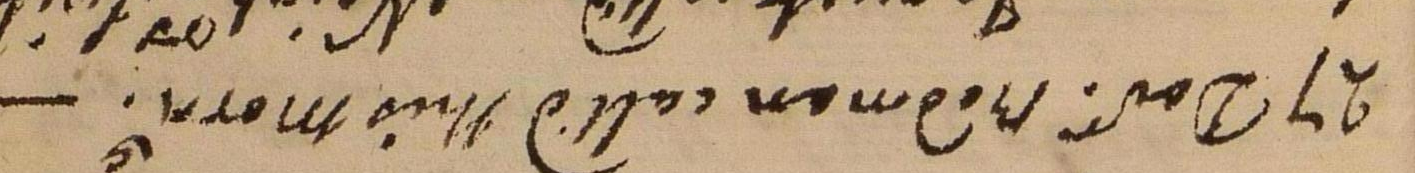27 Doc^r. Redman call'd this Morn^g.-
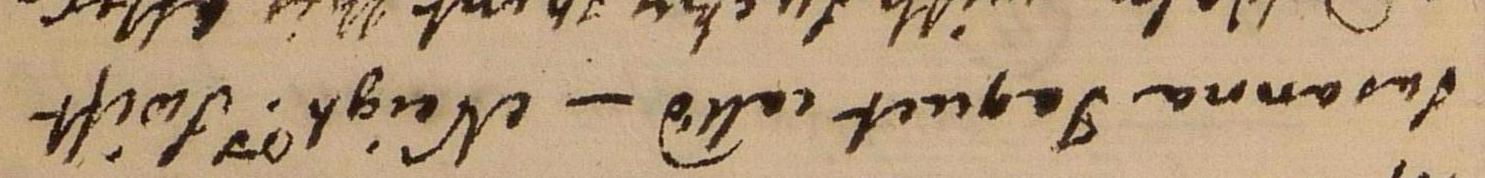Susanna Jaquet call'd- Neigh^rs. Swift
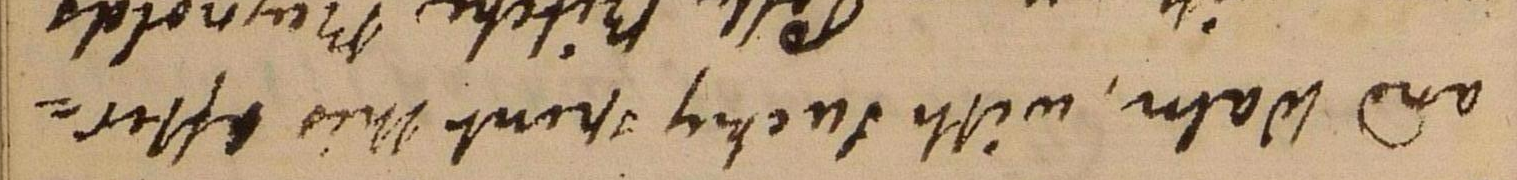and Waln, with Sueky spent this After-
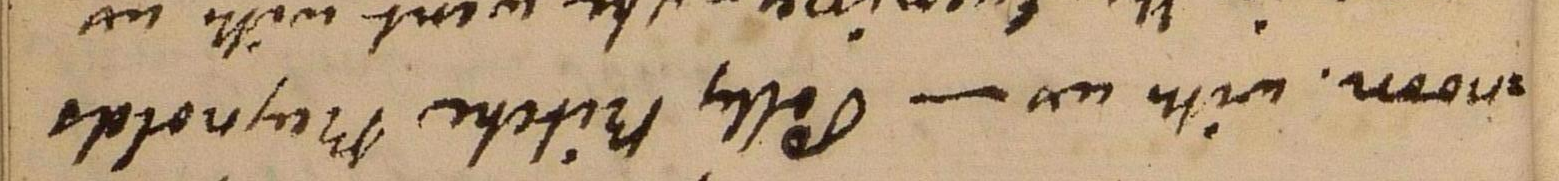-noon. with us- Polly Ritche Reynolds
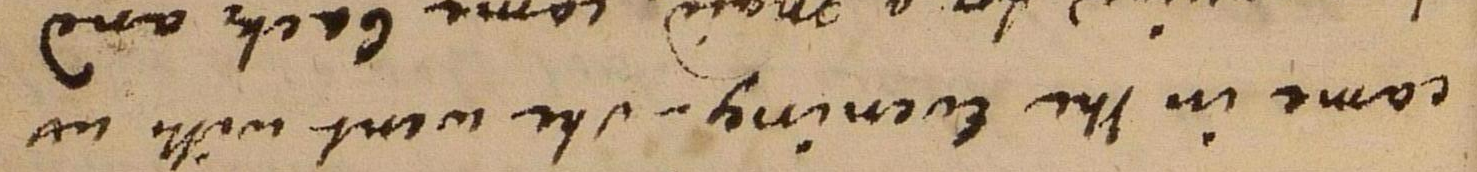came in the Evening- she went with us
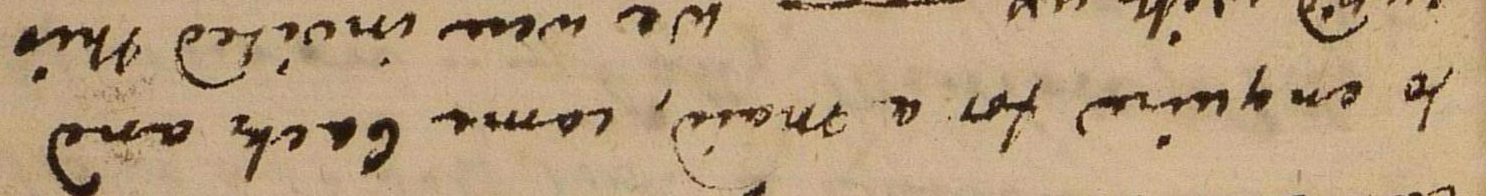to enquire for a maid, came back and
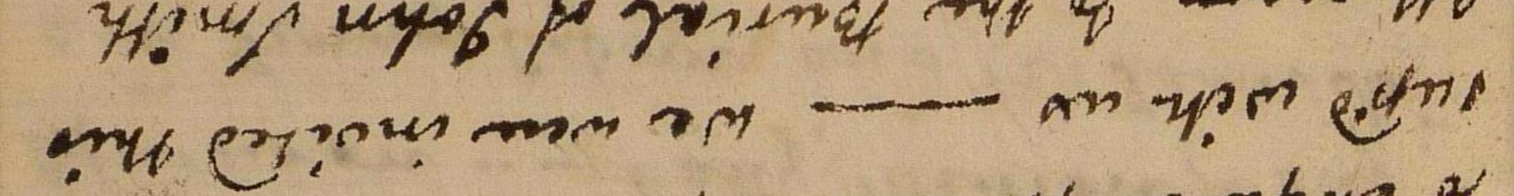sup'd with us- we were invited this
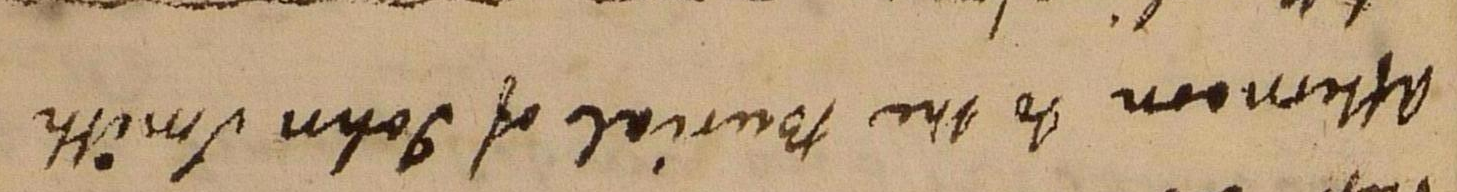Afternoon to the Burial of John Smith
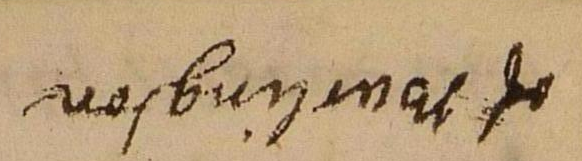of Burlington
